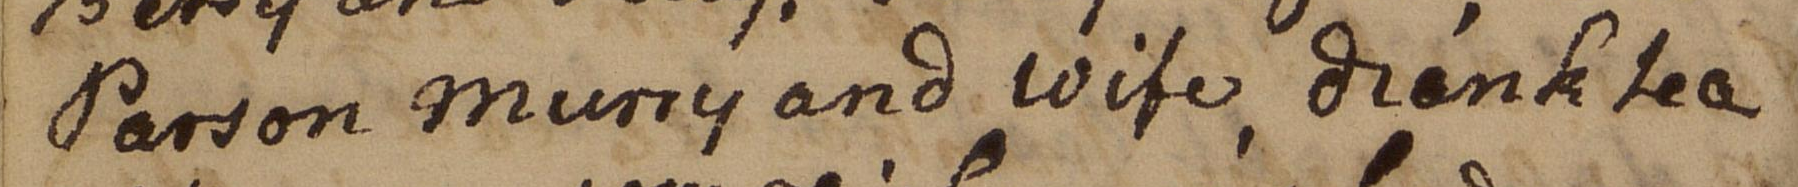Parson Murry and Wife, drank tea
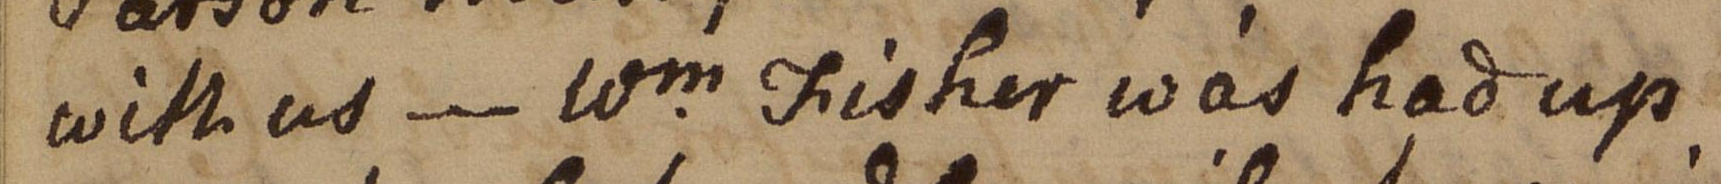with us- W^m. Fisher was had up,
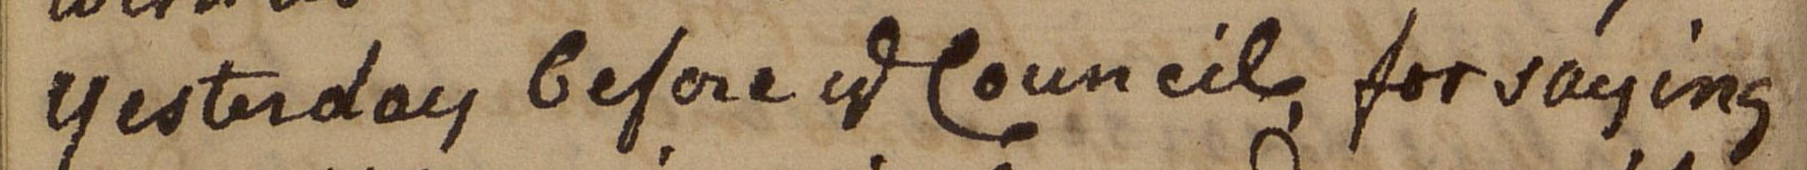yesterday before y^e Council, for saying
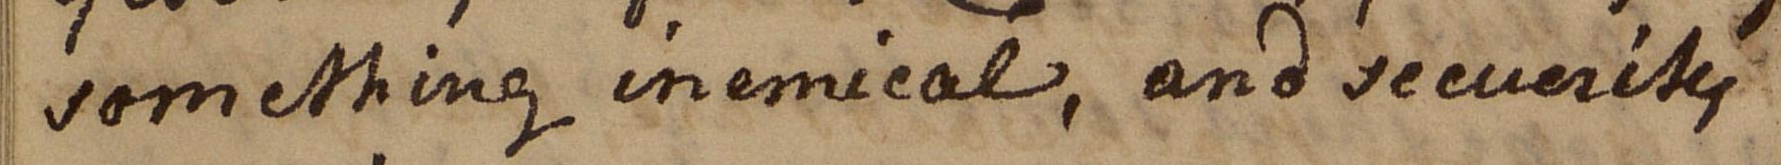something inemical, and secuerity
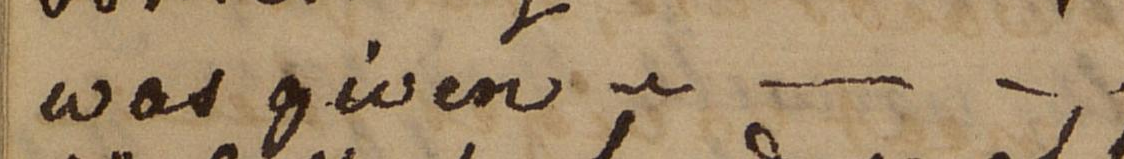was given---
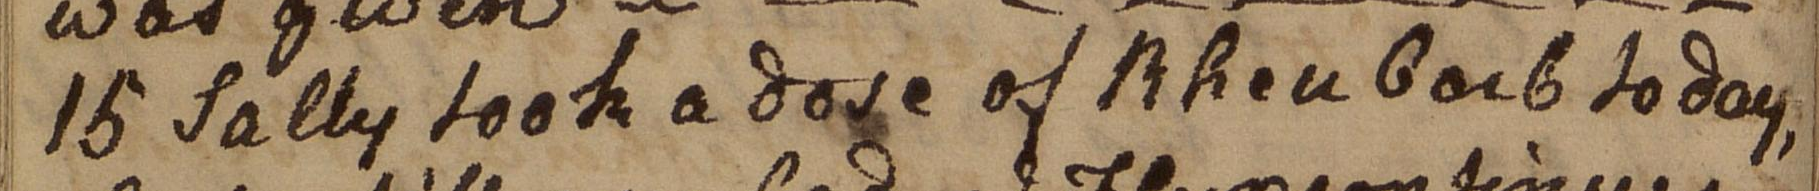15 Sally took a dose of Rheubarb to day,
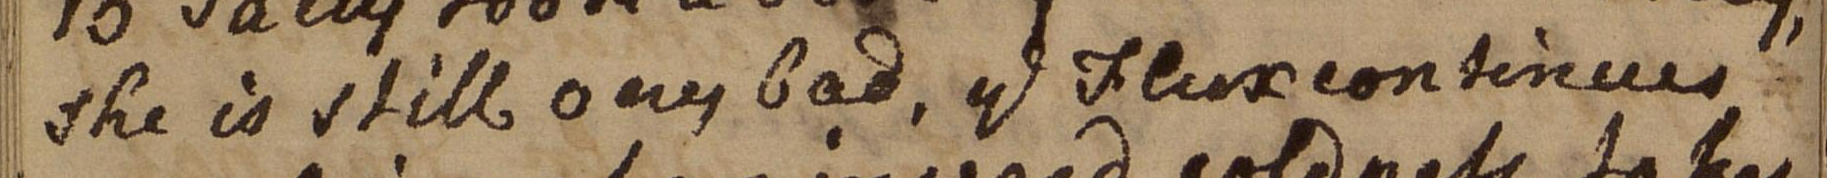she is still very bad, y^e Flux continues
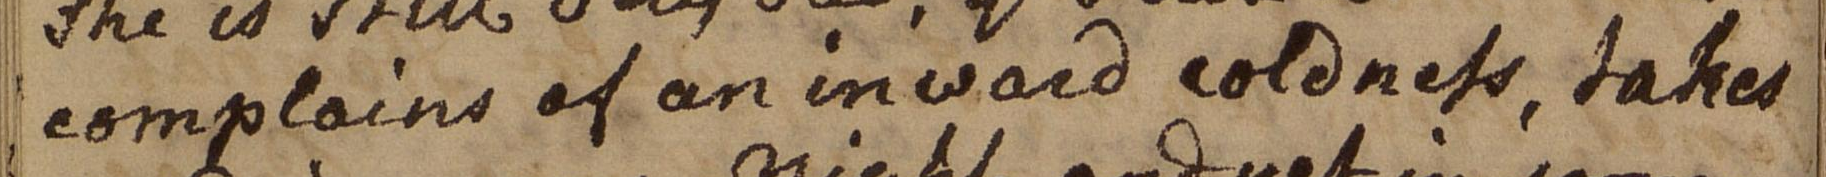complains of an inward coldness, takes
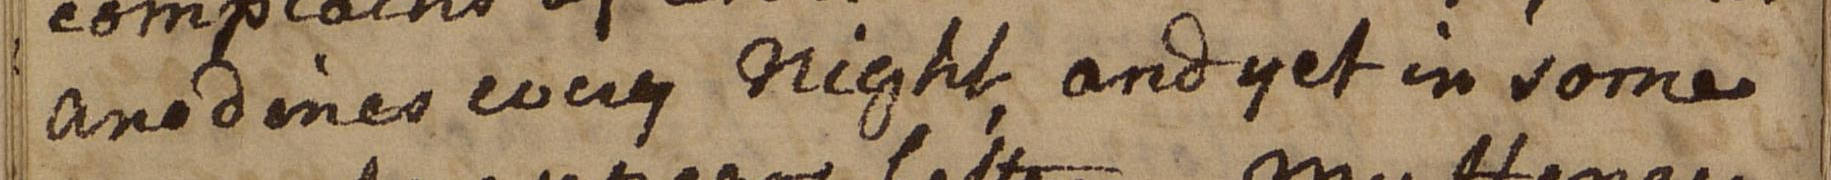anodines every Night, and yet in some
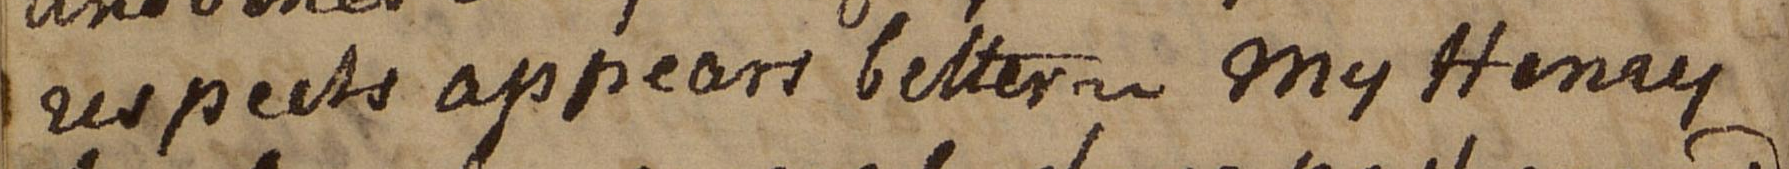respects appears better- My Henry
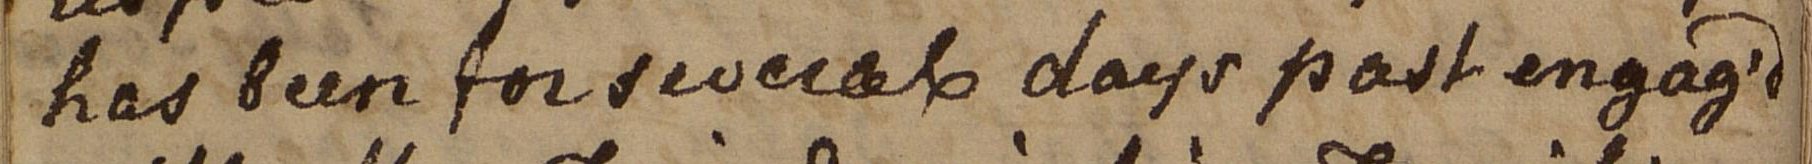has been for several days past engag'd
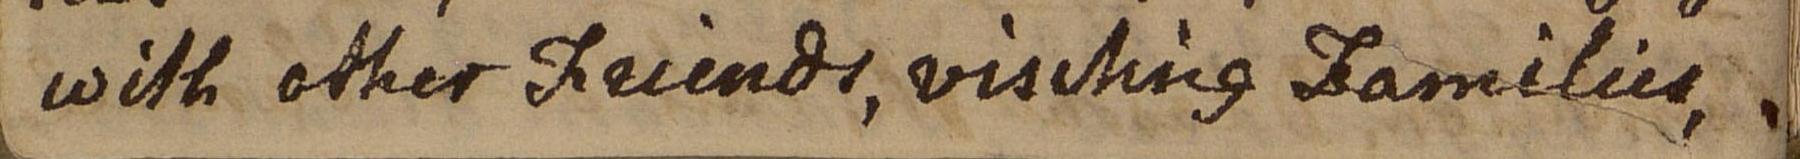with other Friends, visiting Families,
